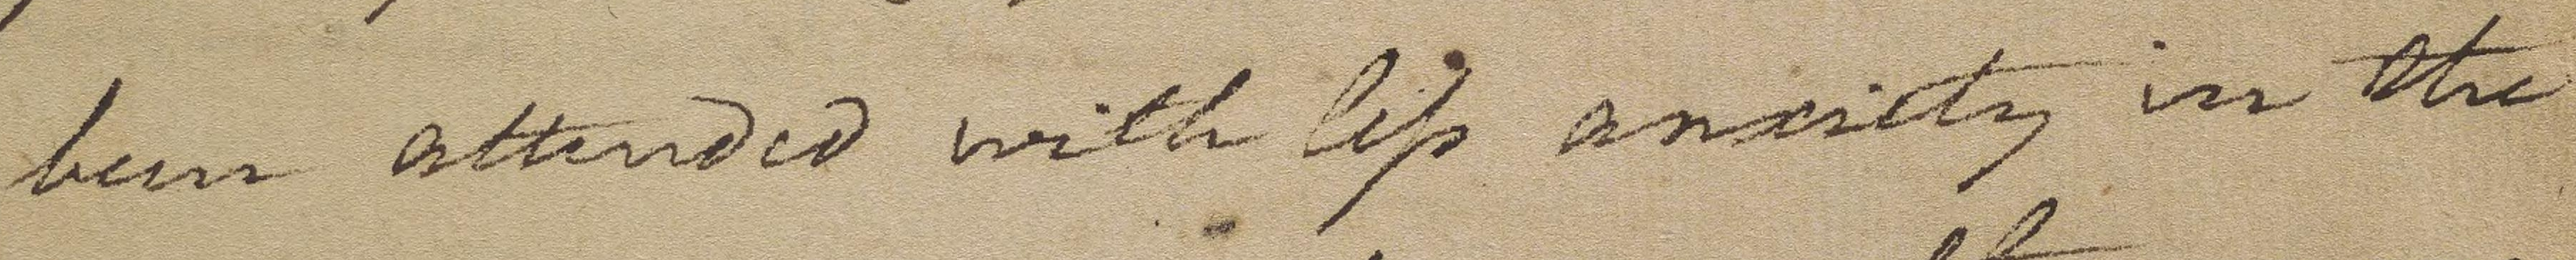been attended with less anxiety in the
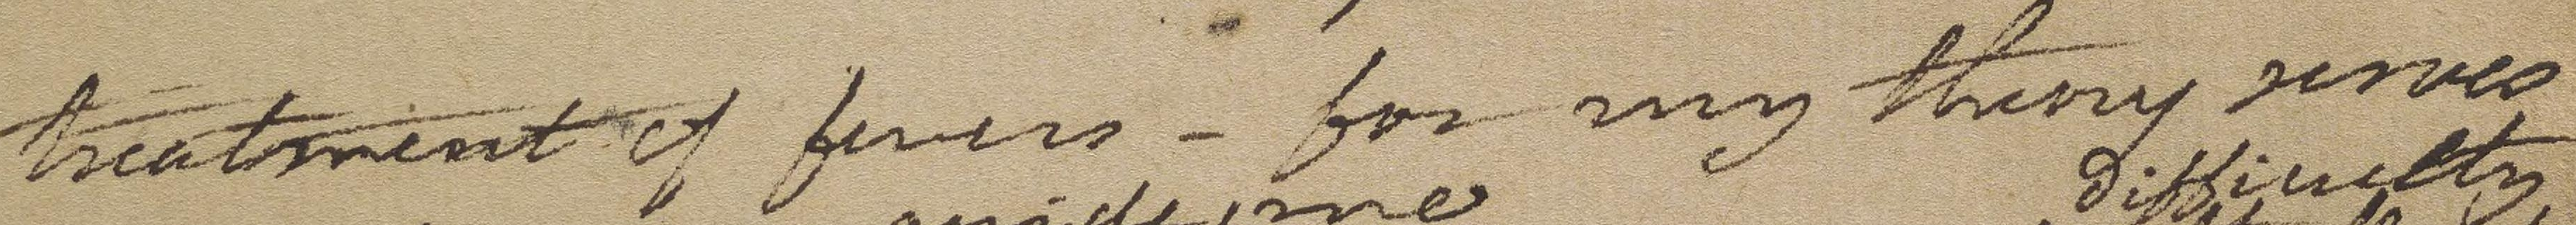treatment of fevers- for my theory serves
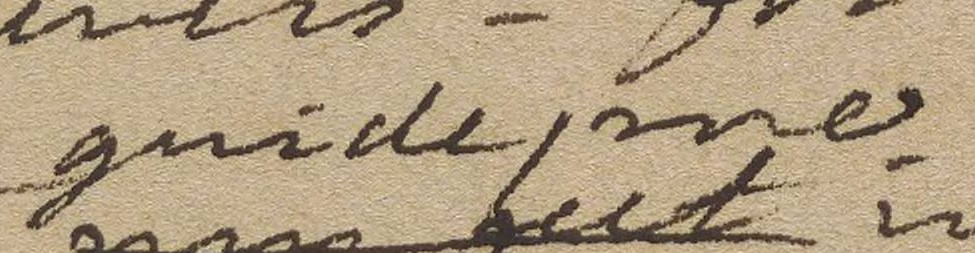guide me
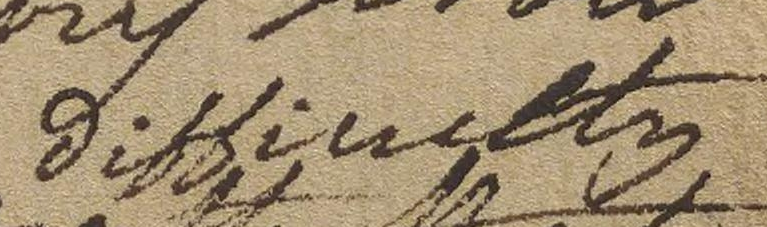difficulty
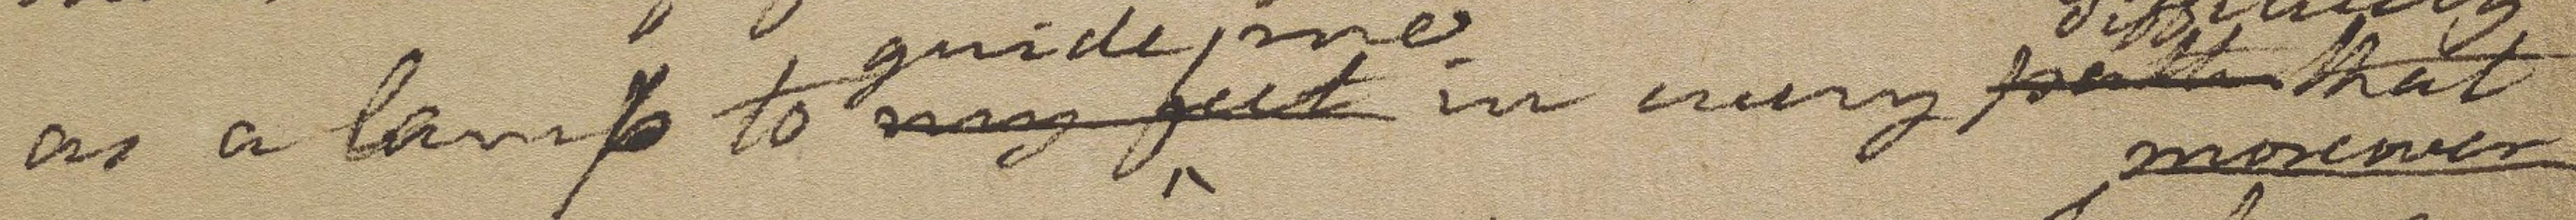as a lamp to [my feet] ^ in every [path] that
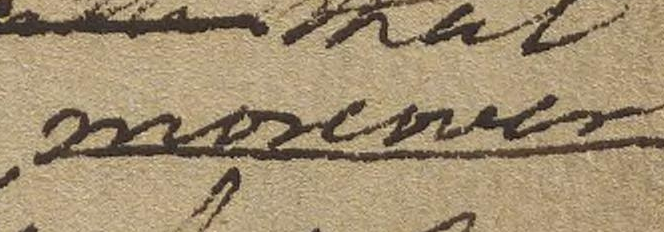moreover
